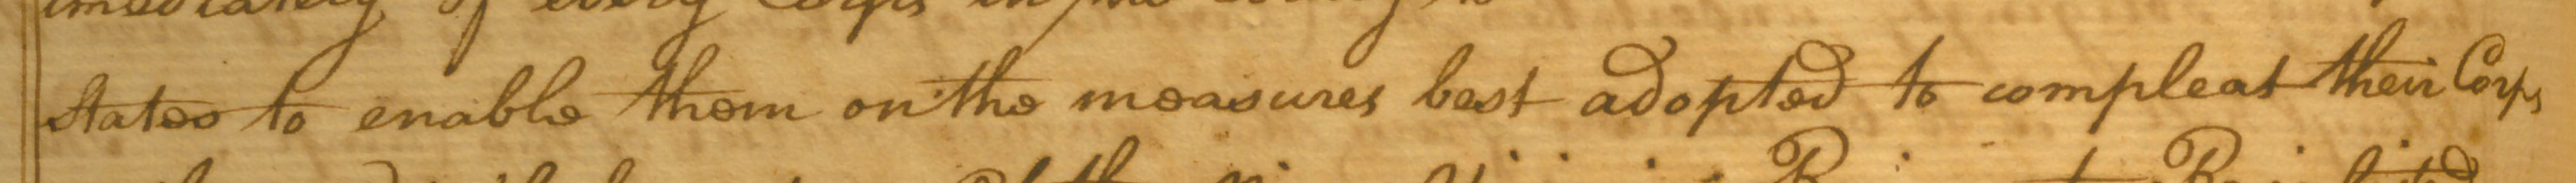States to enable them on the measures best adopted to compleat their Corps
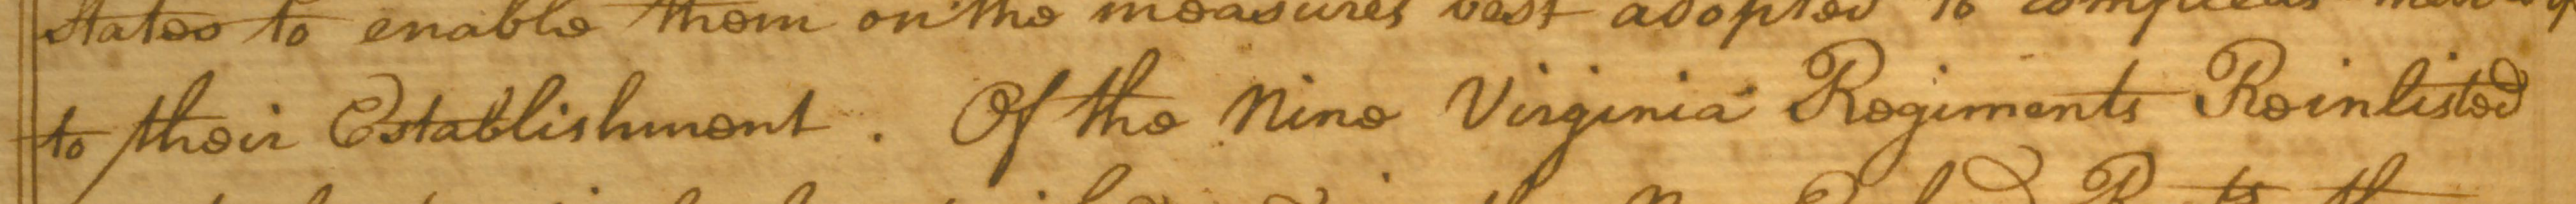to their Establishment. Of the nine Virginia regiments Reinlisted
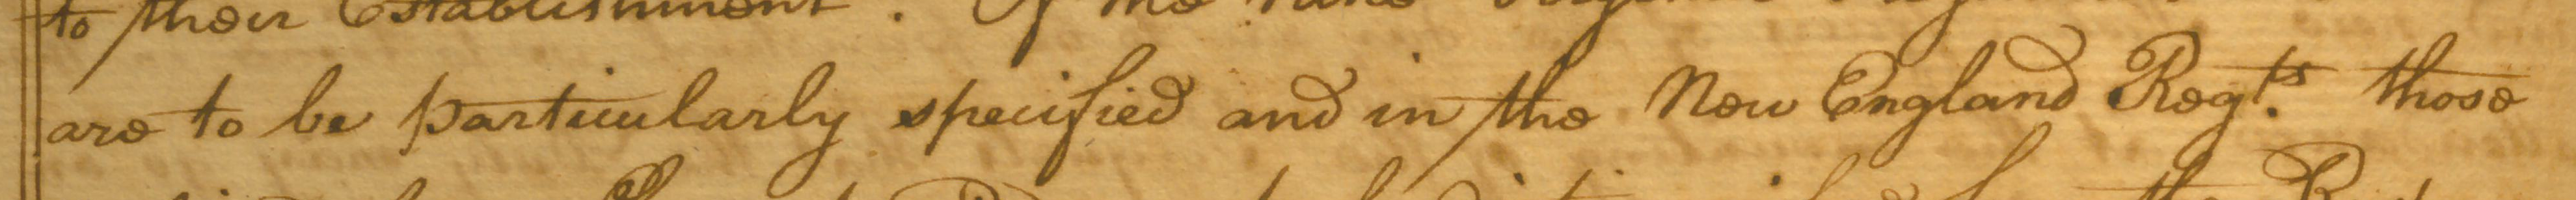are to be particularly specified and in the New England Reg^ts. those
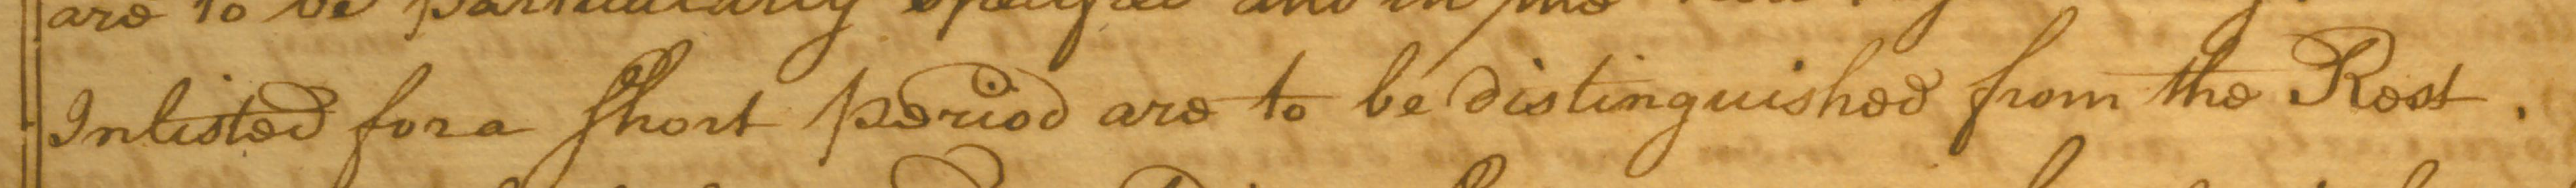Inlisted for a Short period are to be distinguished from the Rest.
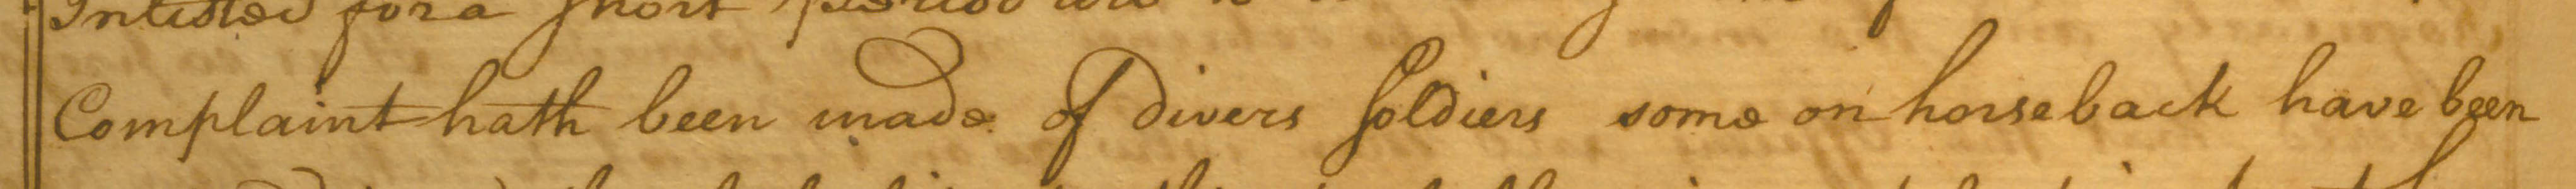Complaint hath been made of divers Soldiers some on horseback have been
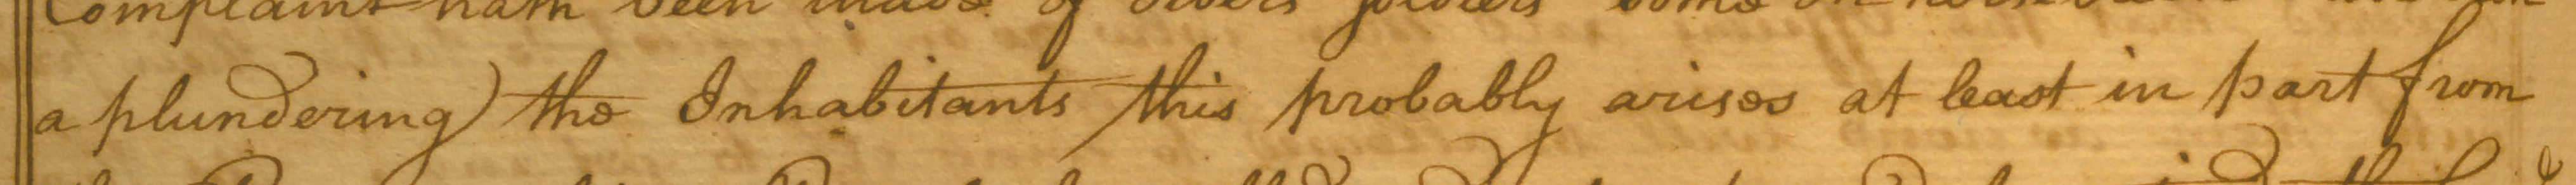a plundering the Inhabitants this probably arises at least in part from
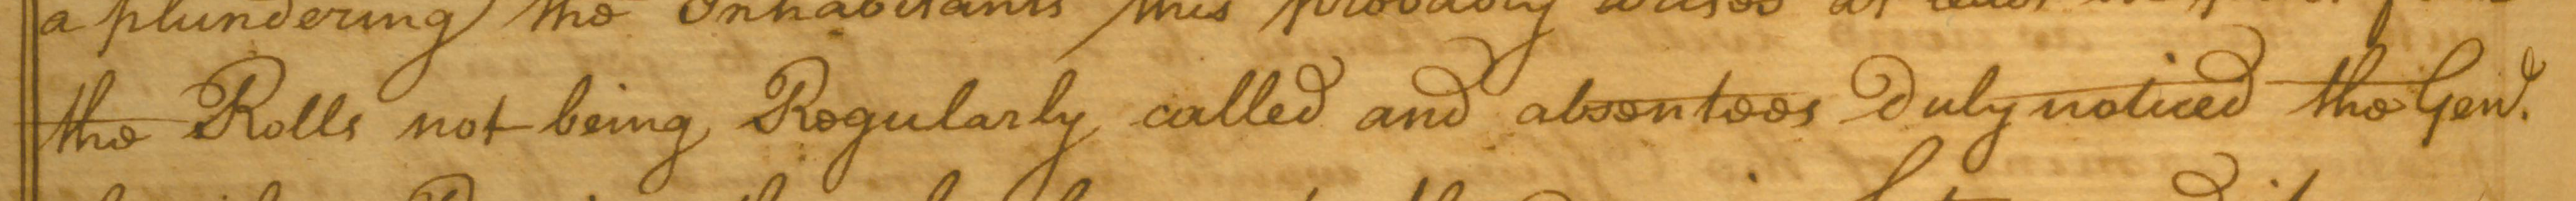the Rolls not being Regularly called and absentees duly noticed the Gen^l.
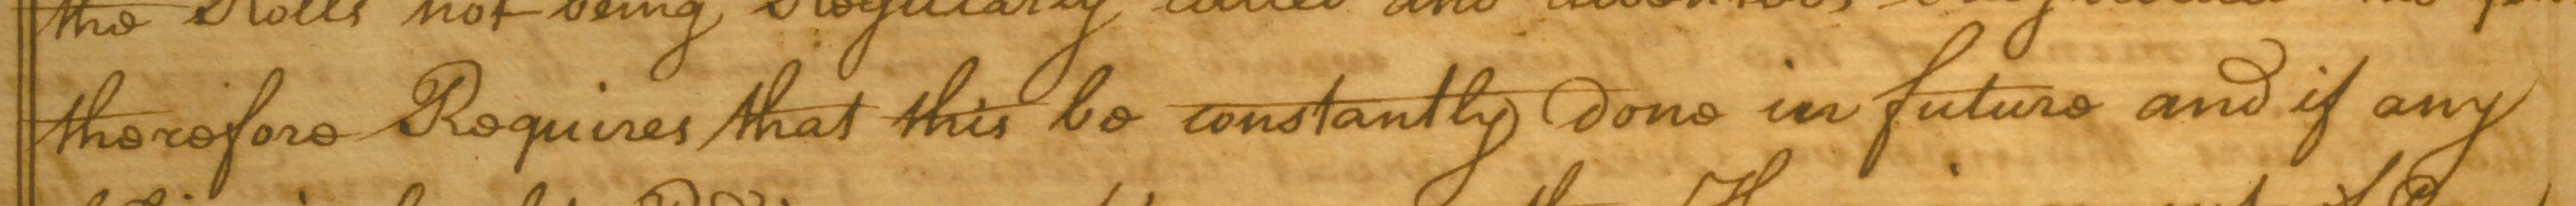therefore Requires that this be constantly done in future and if any
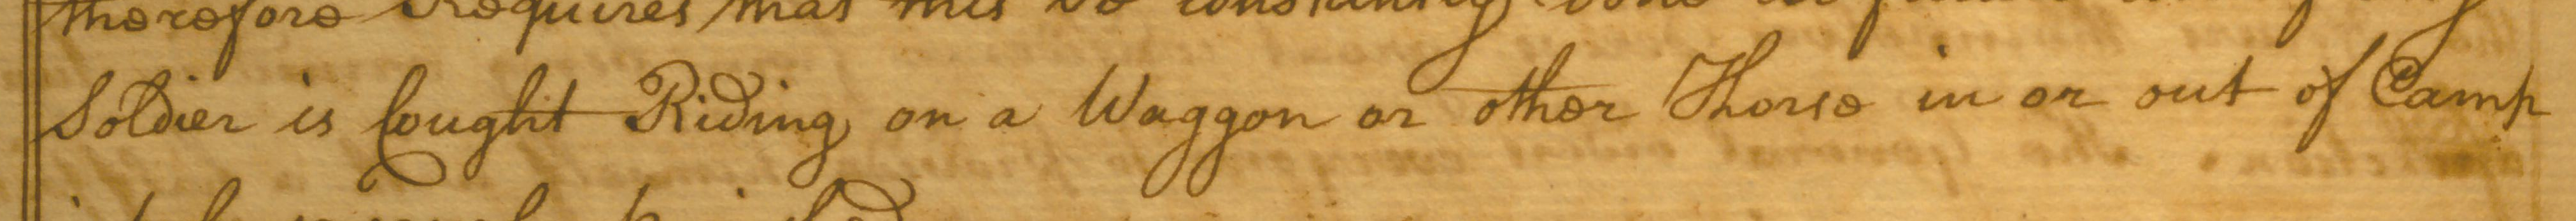Soldier is Cought Riding on a Waggon or other Horse in or out of Camp
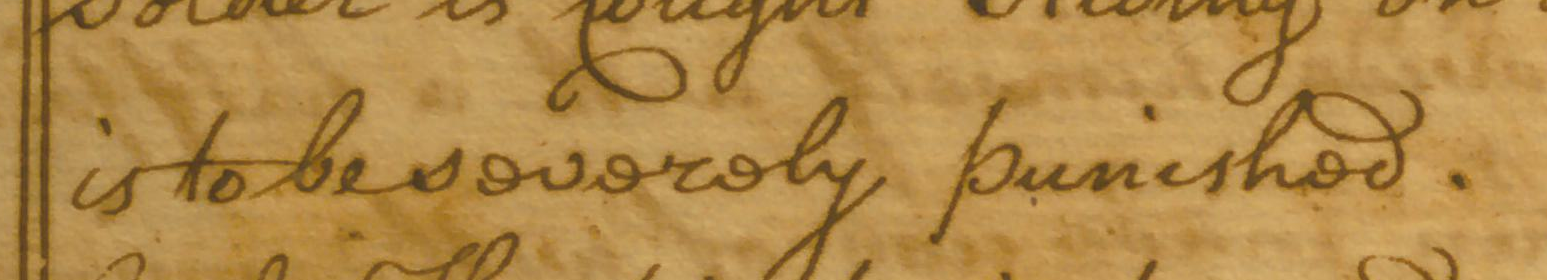is to be severely punished.
